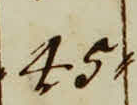45
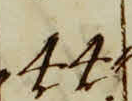44
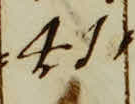41
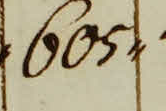605
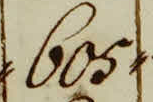605
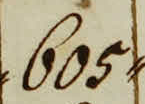505
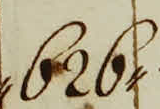626
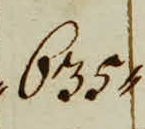635
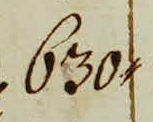630
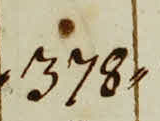378
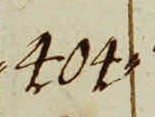404
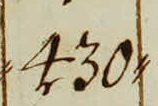430
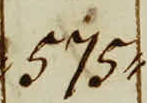575
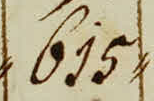615
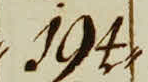194
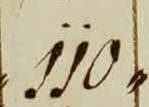110
